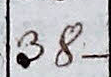38
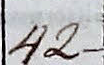42
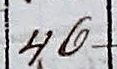46
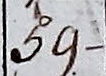59
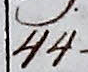44
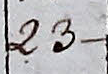23
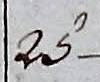25
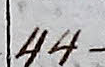44
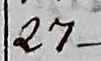27
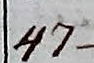47
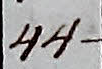44
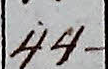44
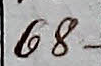68
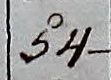54
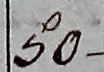50
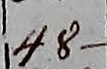48
